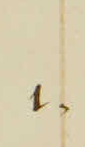1
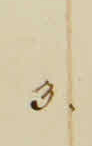3
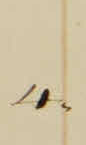4
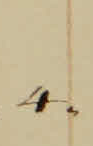4
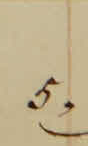5
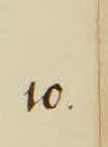10.
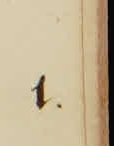1.
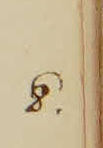8.
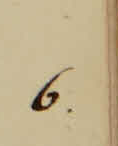6.
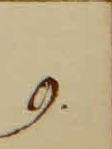9.
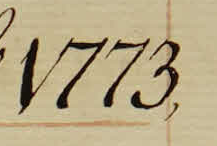1773,
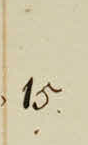15
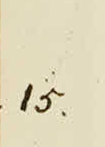15.
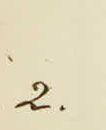2.
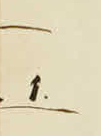1.
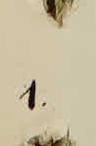1.
